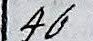46
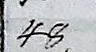48
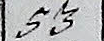53
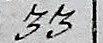33
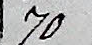70
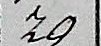29
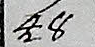48
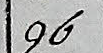96
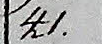41.
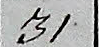31
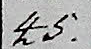45
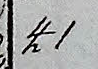41
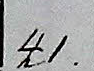41
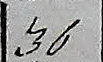36
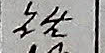24
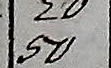50
